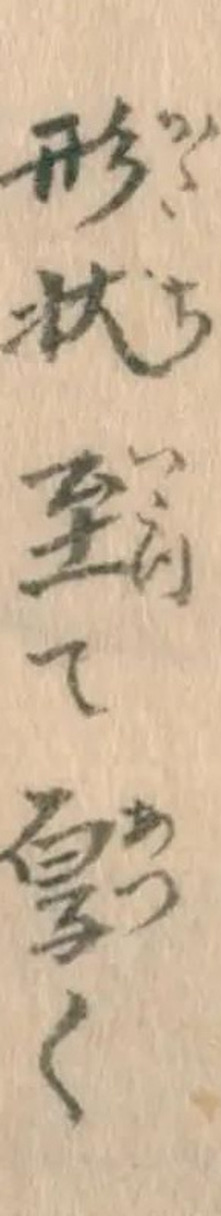形状至て厚く
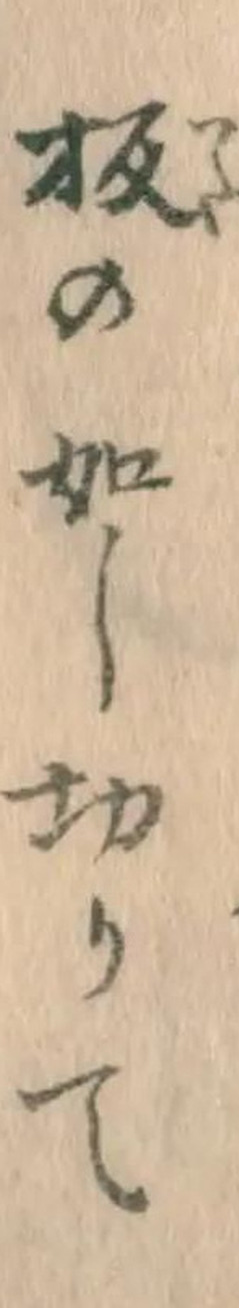板の如し切りて
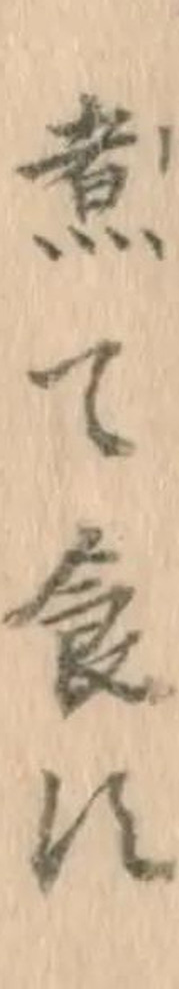煮て食す
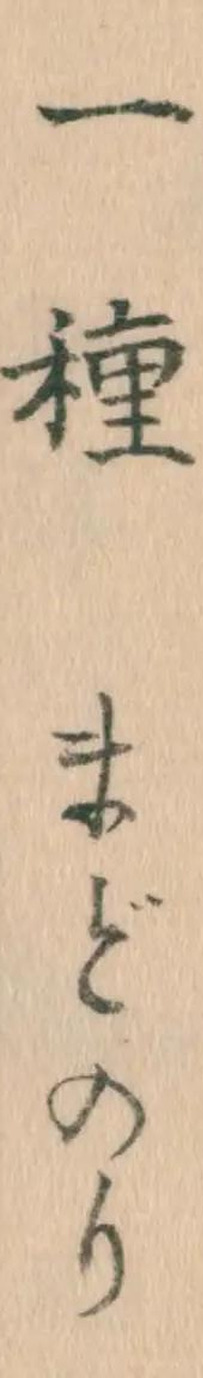一種まどのり
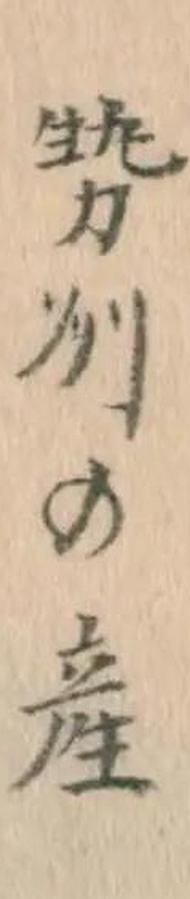勢州の産
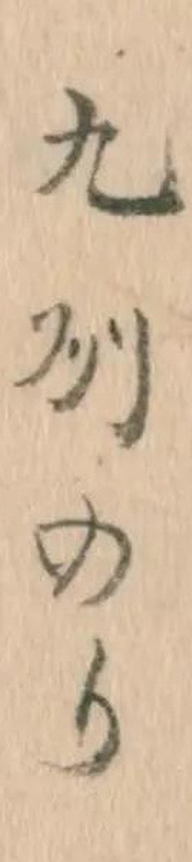九州のり
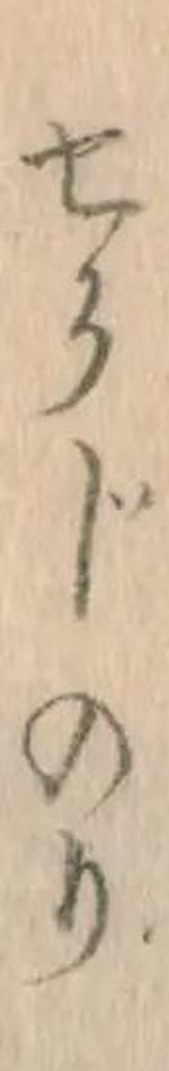せうじのり
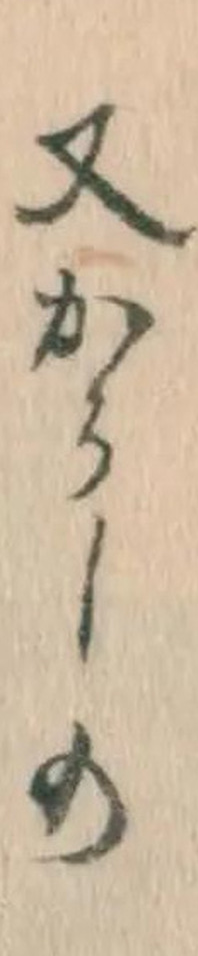又かうしの
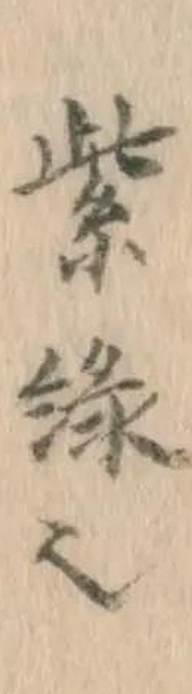紫緑也
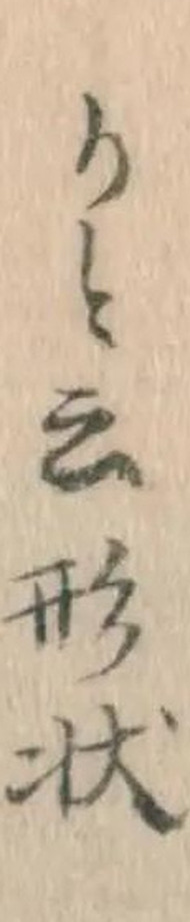りと云形状
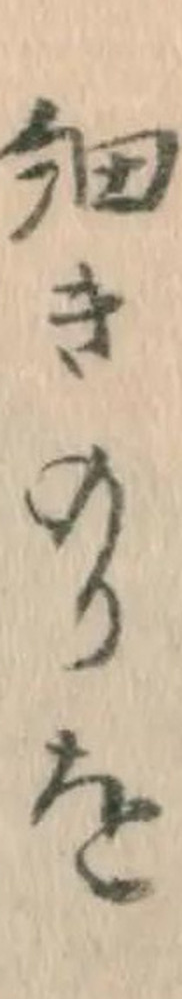細きのりを
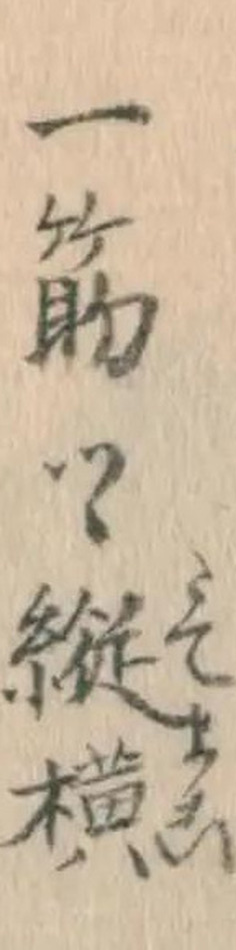一筋つゝ縦横
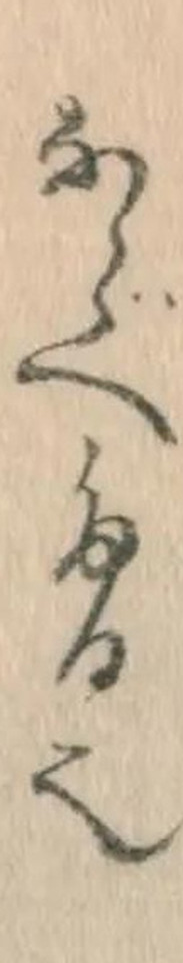ならへたる也

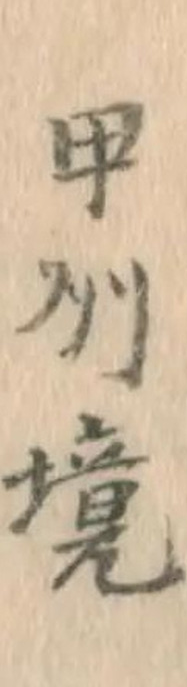甲州境
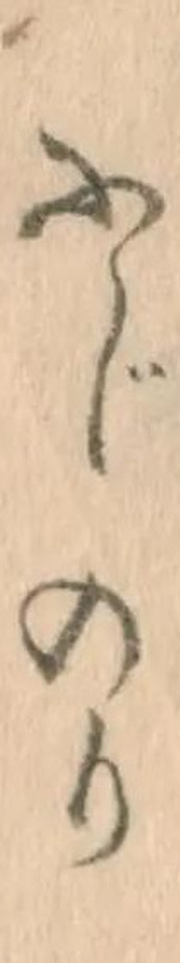ふじのり
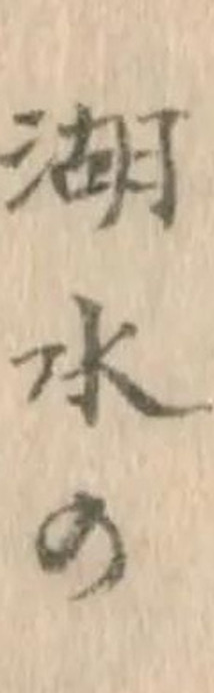湖水の
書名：本草図譜. 巻52-54
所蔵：国立国会図書館 National Diet Library, JAPAN
